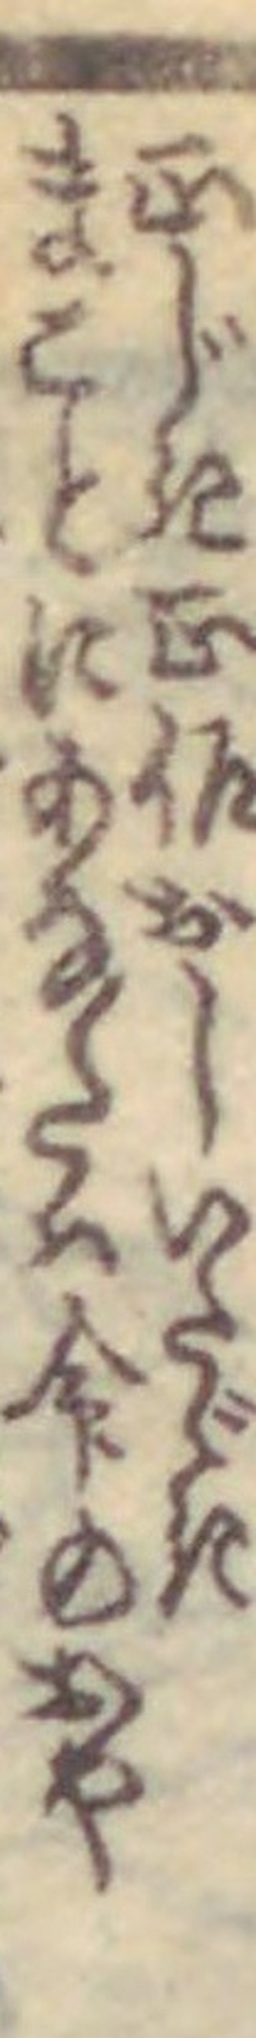まことにあなたは命のおや
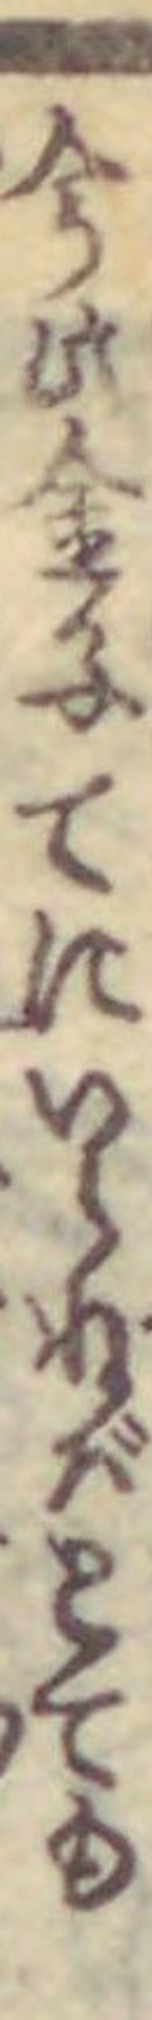今此金子てにいらねばとても
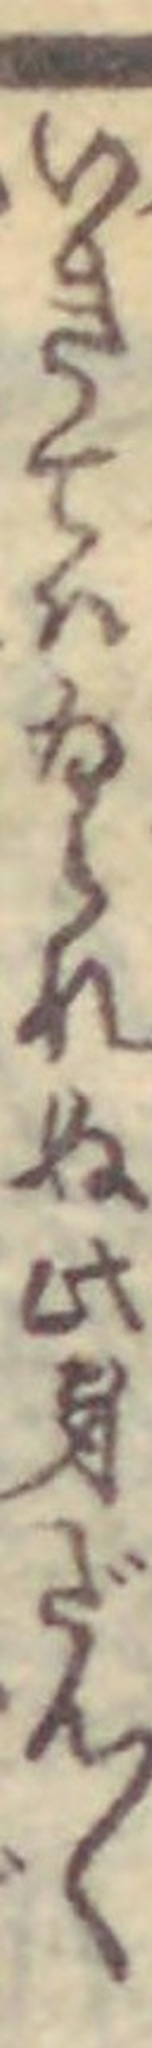いきてはゐられぬ此身だん〳〵
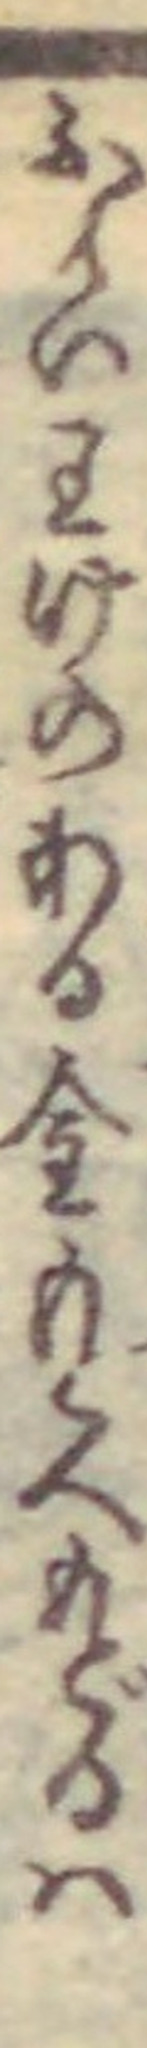ふかいわけのある金もとへもどるは
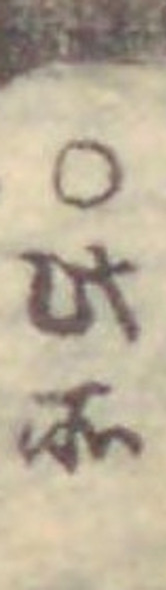○此所
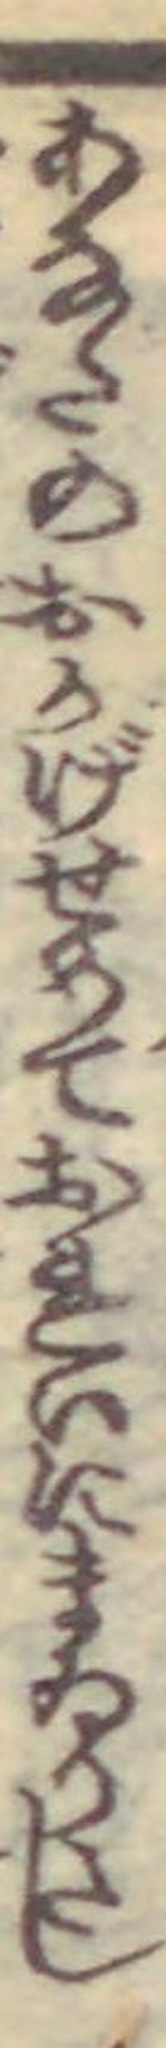あなたのおかげせめておれいにまゐりたし
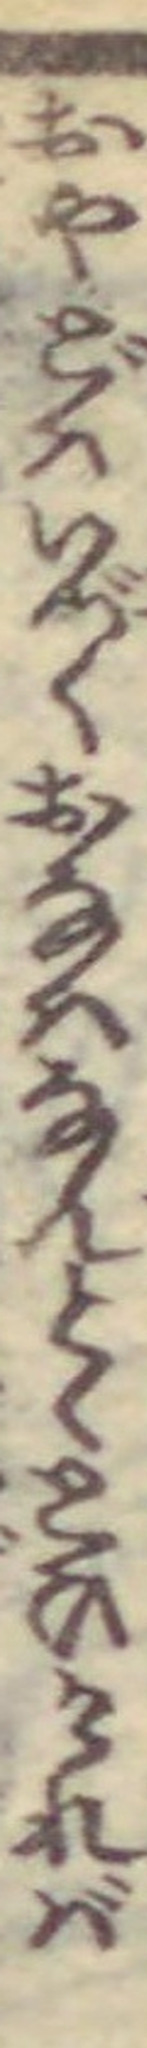おやどはいづくおなはなんとゝとひければ
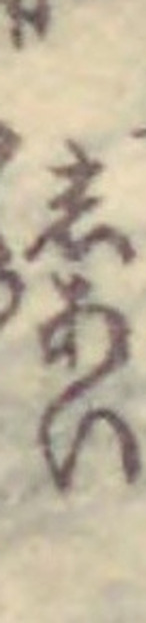しあい
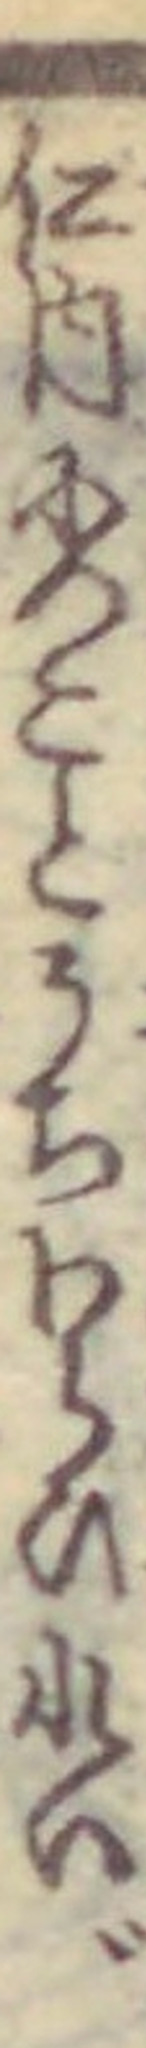仁内につことうちわらひれはゞ
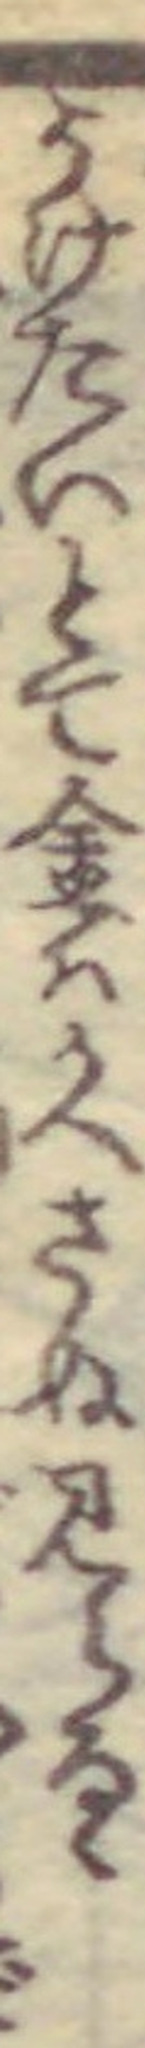うけたいとて金はかへさぬ見らるゝ
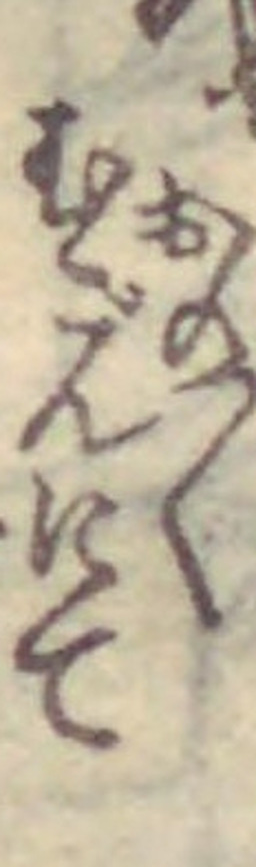むごんにて
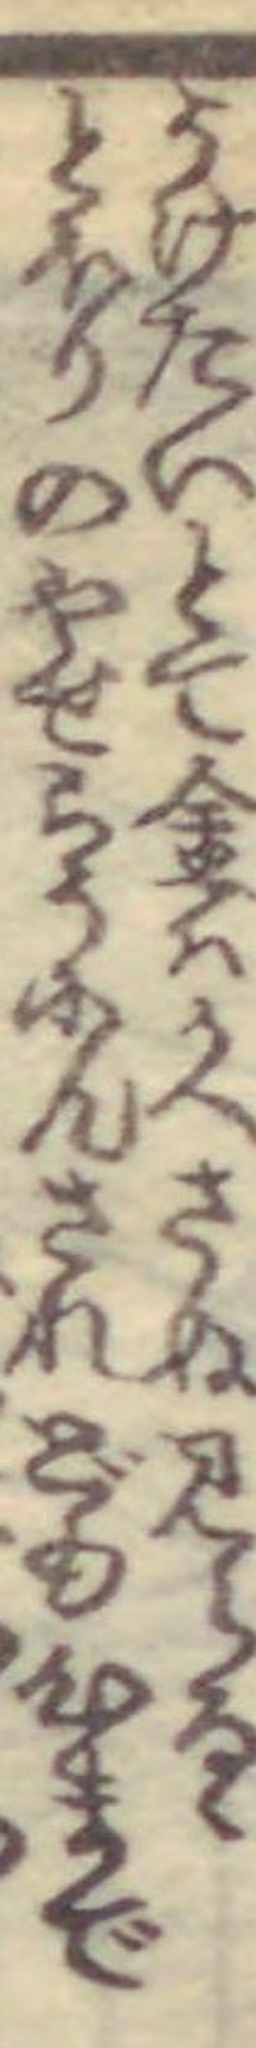とほりのやせらうにんされども心まで
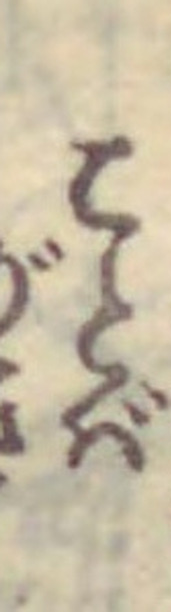ことば
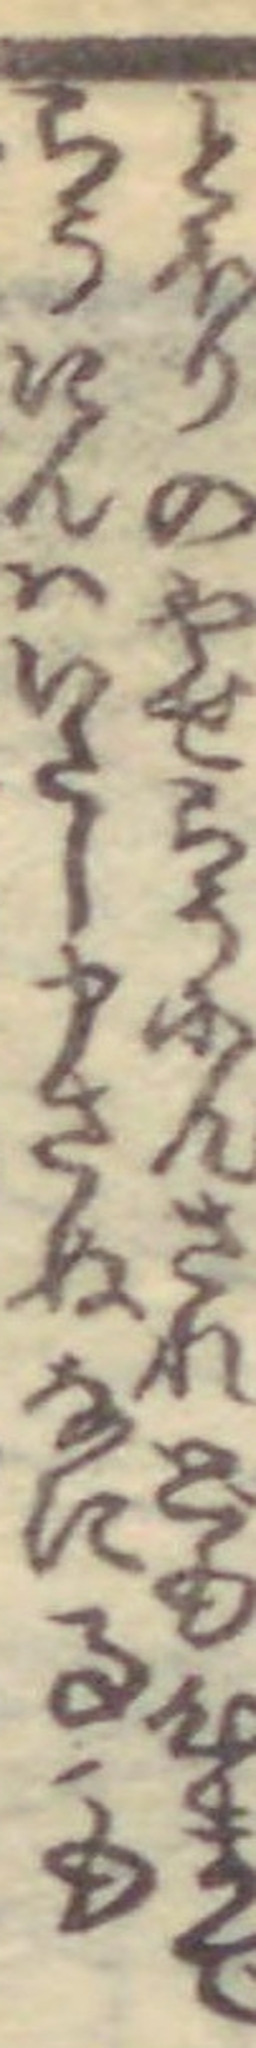らうにんはいたし申さぬなに事にも
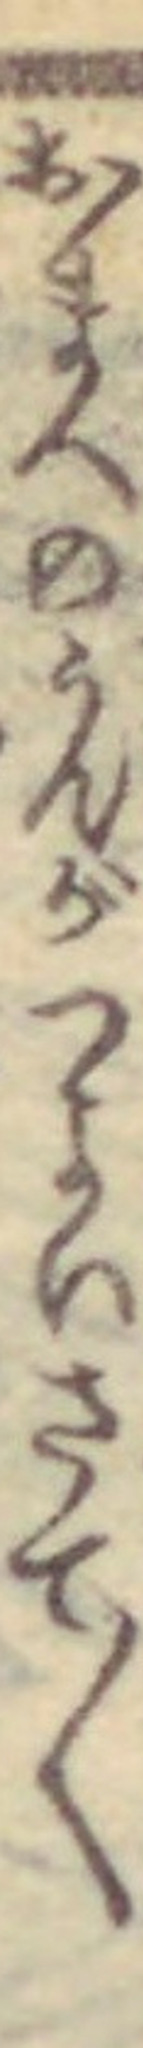おまへのうんがつよいさて〳〵
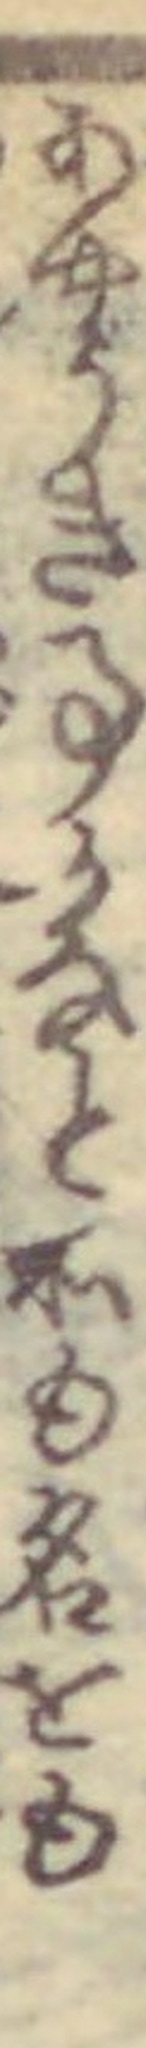あやうき事かなと所も名をも
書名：八ツ目鱣因縁物語 3巻
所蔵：国立国会図書館 National Diet Library, JAPAN
